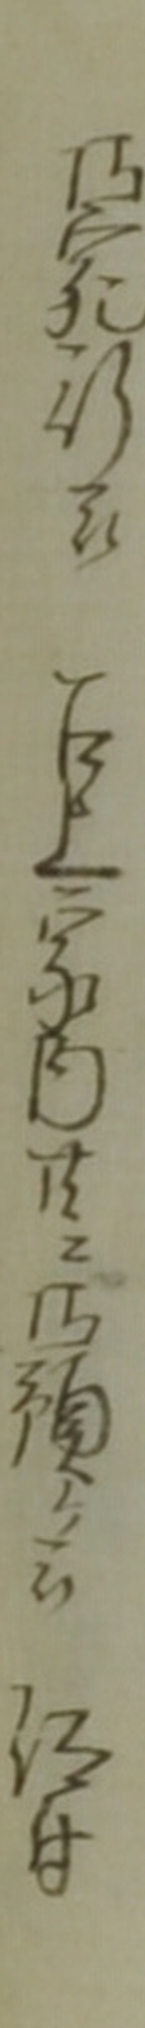御宛行被召上家内共ニ御預ケ被仰付
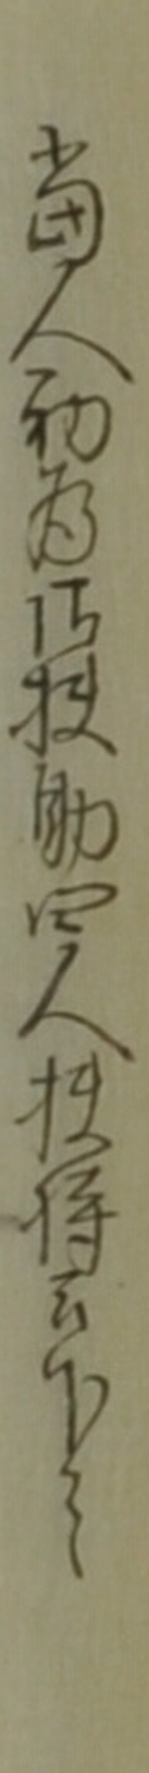当人初為御扶助四人扶持被下之
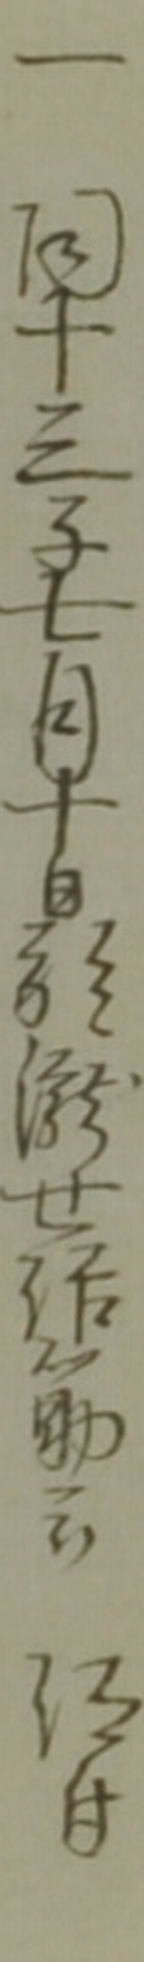一同十三子七月十日於滝世話筋被仰付
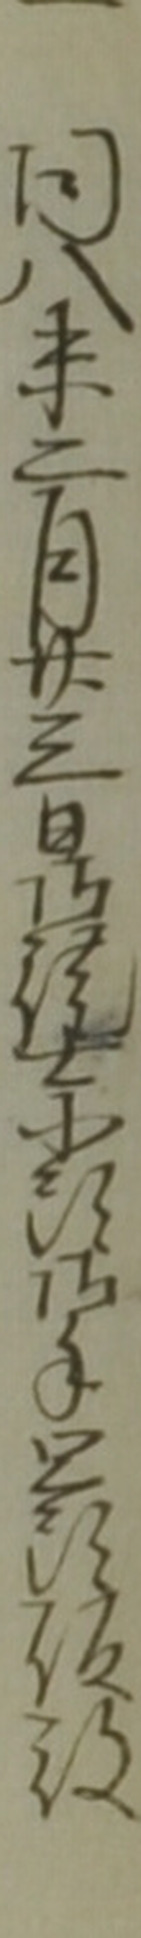一同八未二月廿三日御徒士小頭御手廻頭仮役
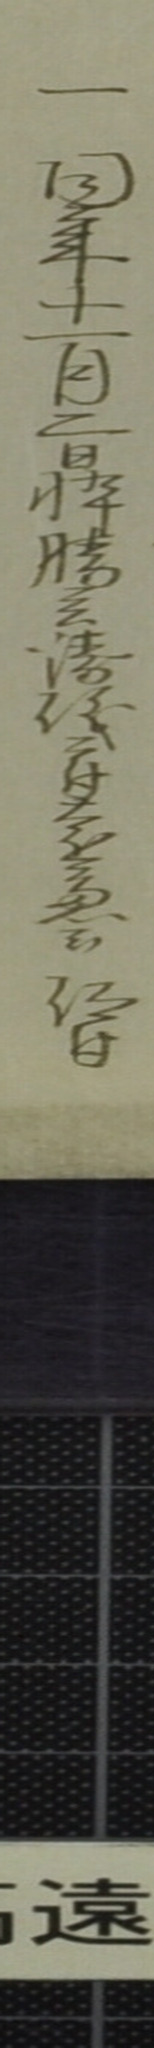一同年十一月二日忰勝兵衛儀ニ付遠慮被仰付

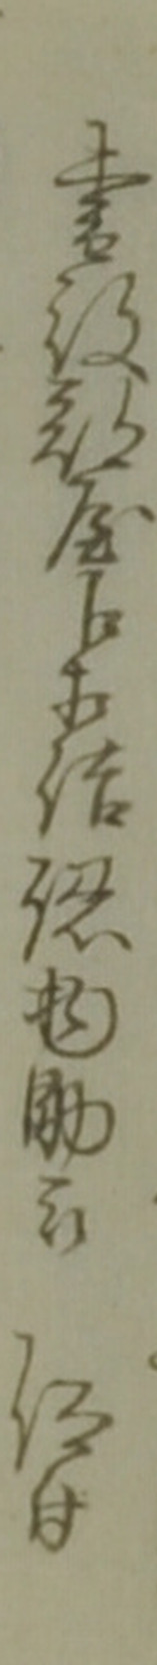書役部屋江相詰認物助被仰付
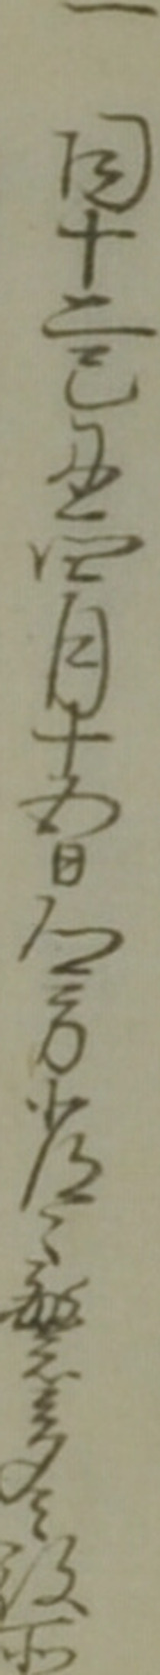一同十二己丑四月十五日郷方常々繁多之役所ニ付
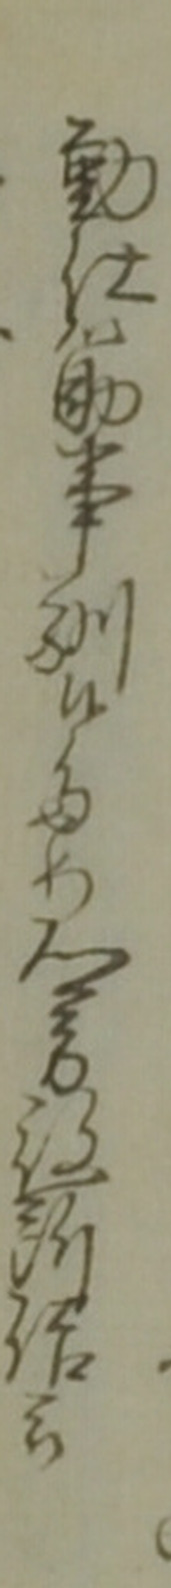勤仕筋事馴候ため郷方役所詰被
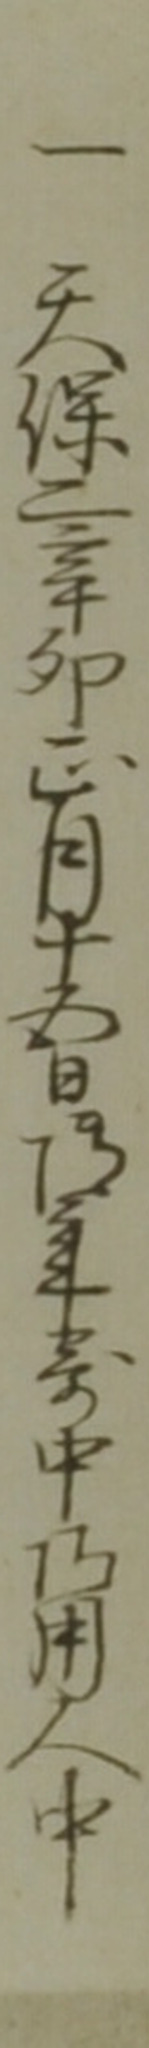一天保二辛卯正月十五日御年寄中御用人中
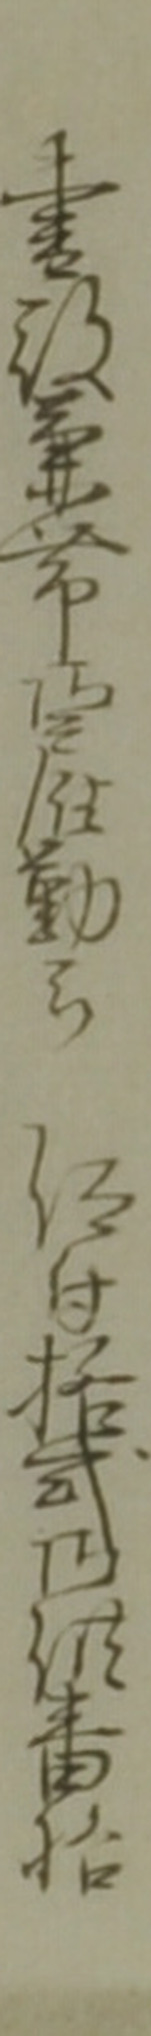書役兼帯御雇勤被仰付格式御供番格
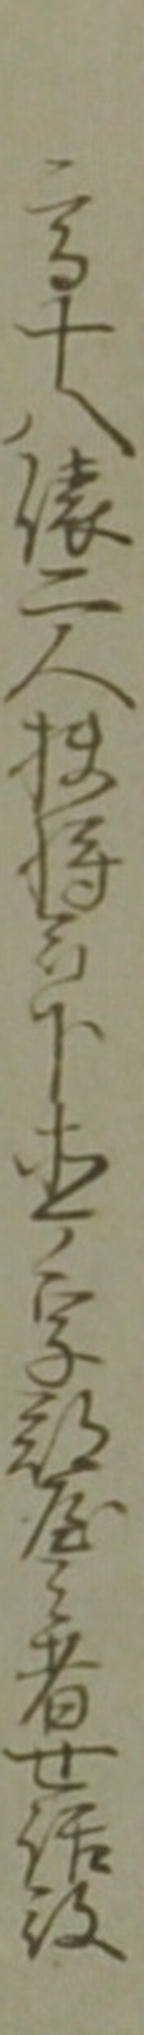高十八俵二人扶持被下直ノ字部屋之者世話役
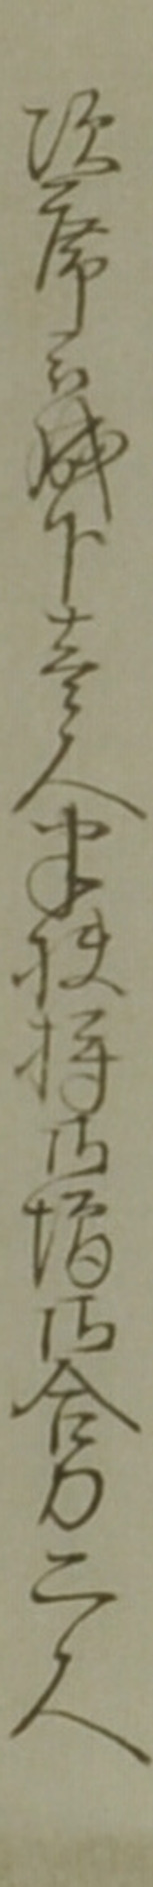次席被成下壱人半扶持御増御合力二人
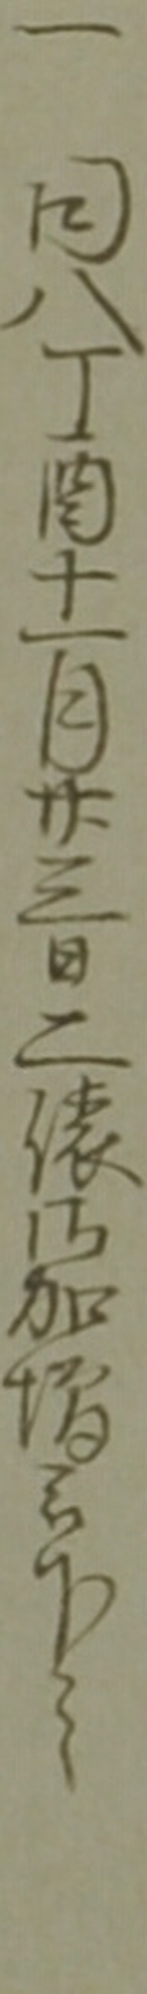一同八丁酉十一月廿三日二俵御加増被下之
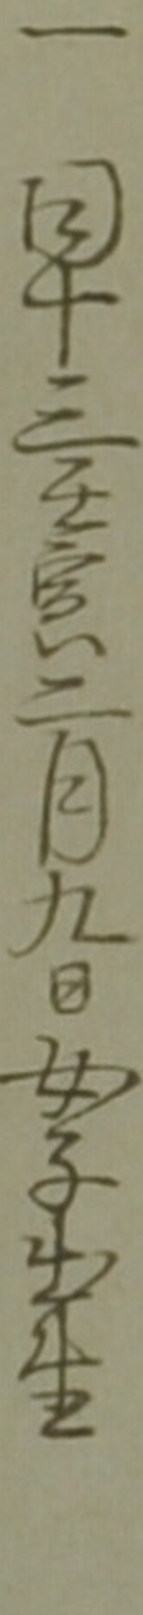一同十三壬寅二月九日女子出生
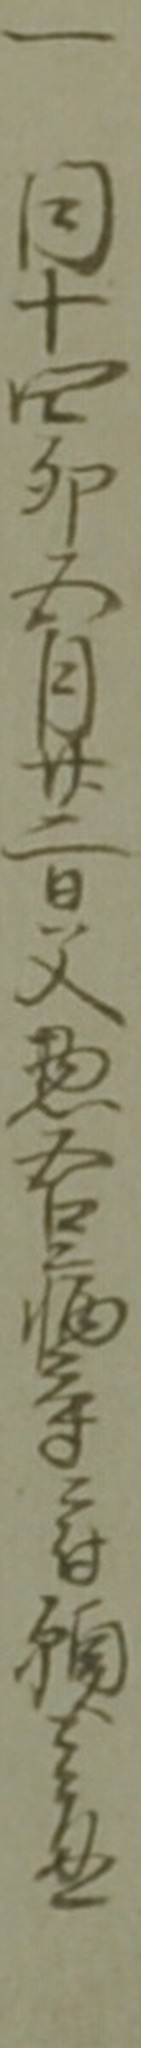一同十四卯五月廿二日父惣吾病気ニ付願之通

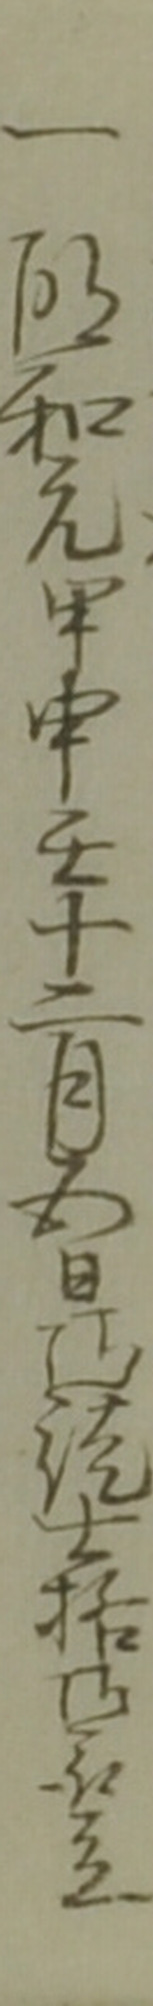一明和元甲申閏十二月五日御徒士格御取立
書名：無足諸士勤仕録（三）
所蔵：伊那市立高遠町図書館・合同会社AMANE
